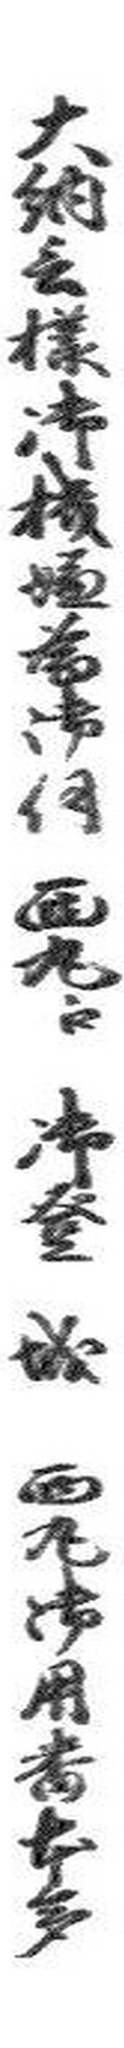大納言様御機嫌為御伺西丸江御登城西丸御用番本多
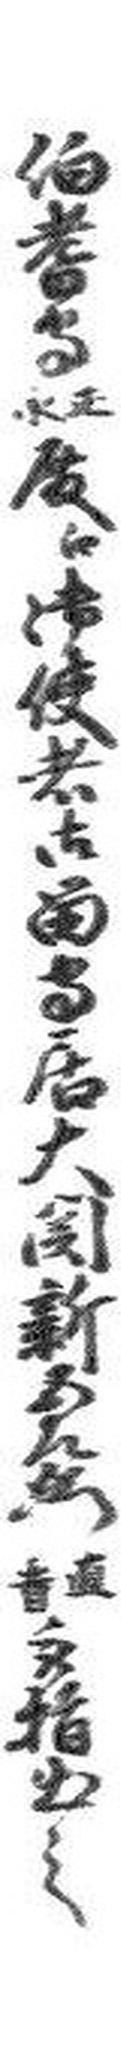伯耆守正永殿江御使者御留守居大関新五左衛門直被指出之
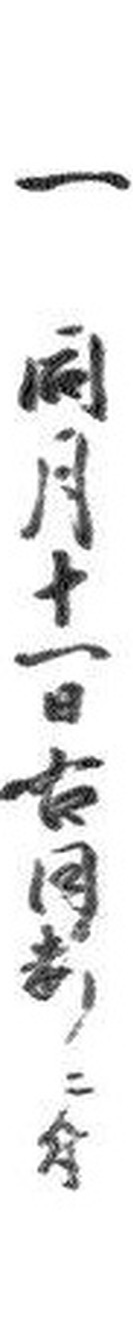一同月十一日右同断ニ付
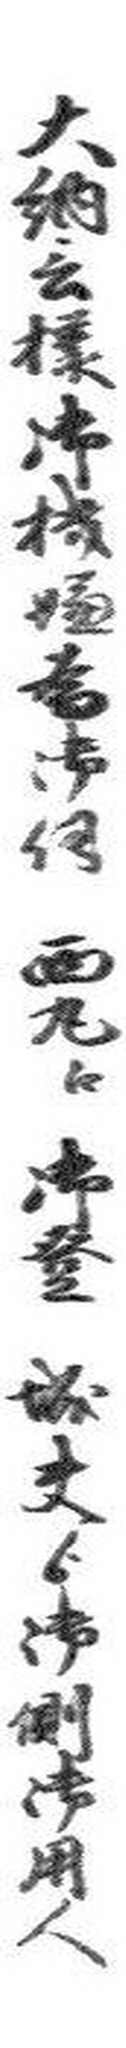大納言様御機嫌為御伺西丸江御登城夫ゟ御側御用人

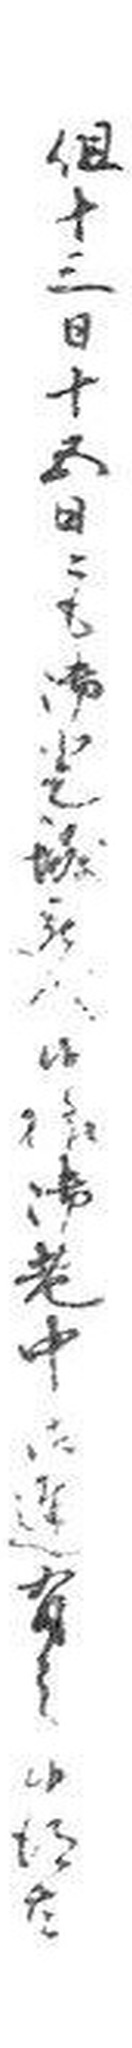但十三日十五日ニも御登城被成候様御老中御達有之候得共
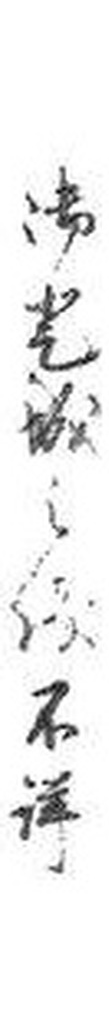御登城之儀不詳
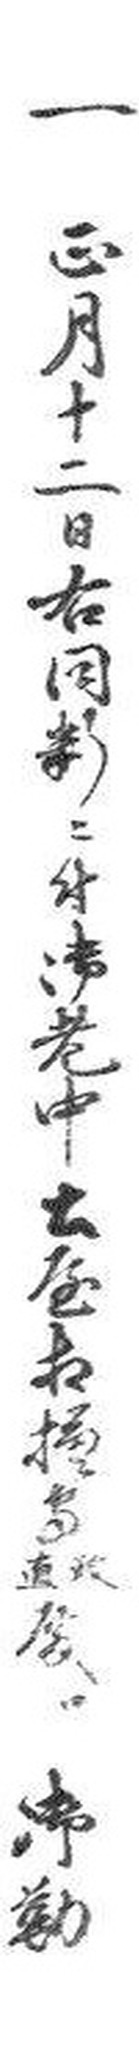一正月十二日右同断ニ付御老中土屋相模守政直殿江御勤
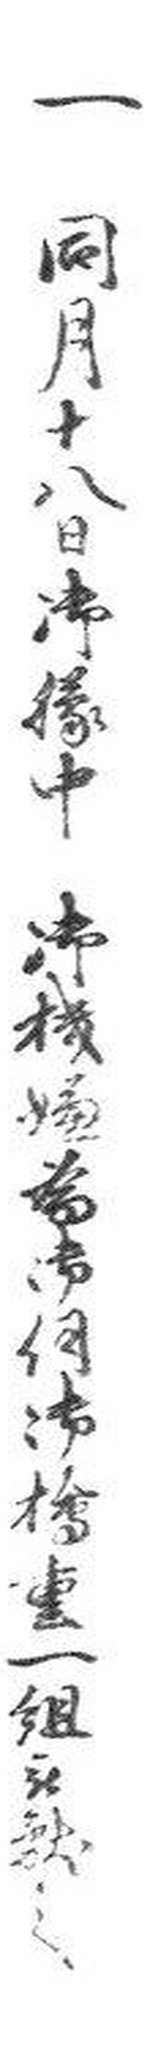一同月十八日御縁中御機嫌為御伺御檜重一組被献之
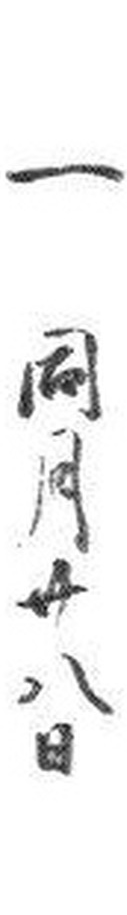一同月廿八日
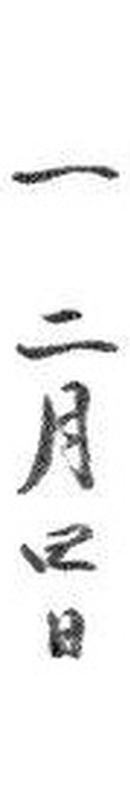一二月四日
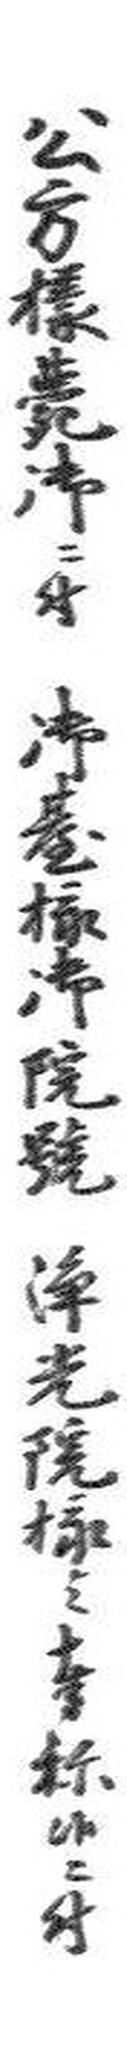公方様薨御ニ付御台様御院号浄光院様と奉称候ニ付
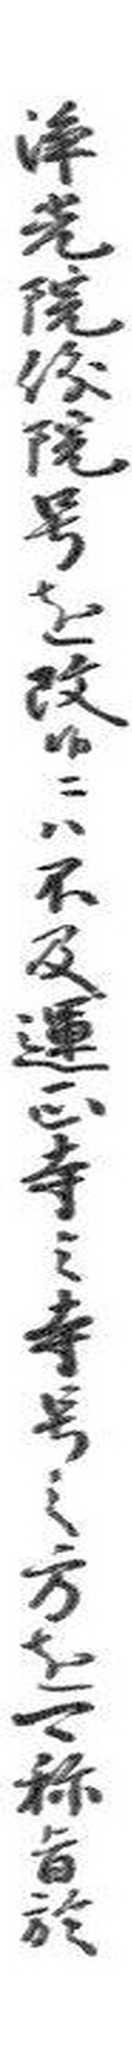浄光院儀院号を改候ニハ不及運正寺之寺号之方を可称旨於
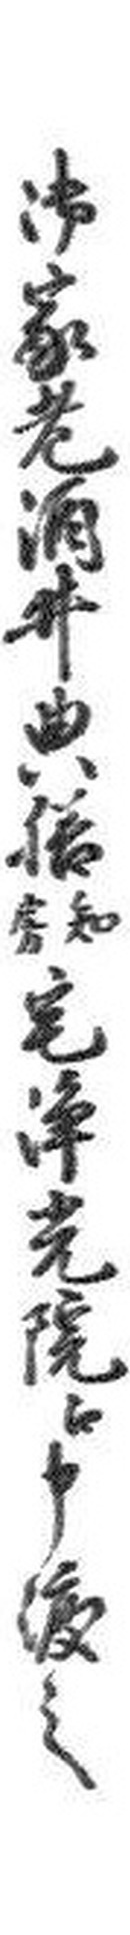御家老酒井典膳知房宅浄光院江申渡之
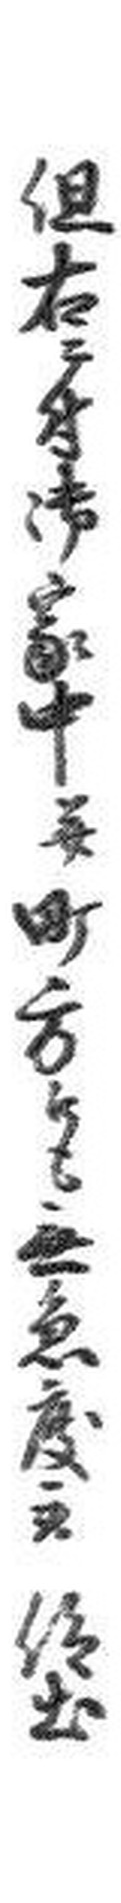但右ニ付御家中幷町方江も無急度被仰出
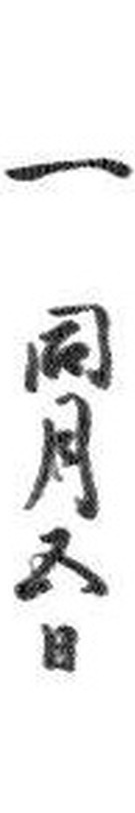一同月五日
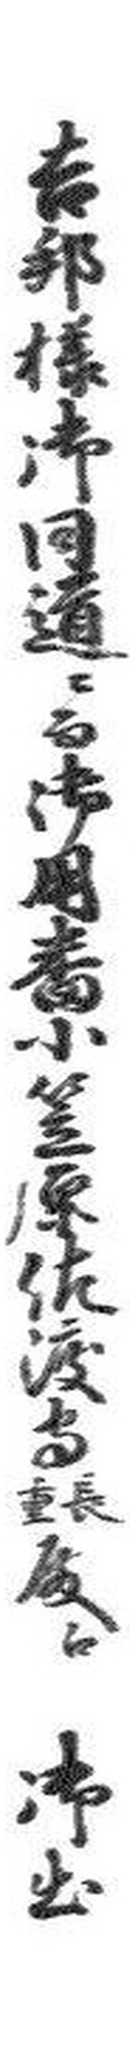吉邦様御同道ニ而御用番小笠原佐渡守長重殿江御出
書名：家譜 二十五 吉品公 従宝永六年到同七年
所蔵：福井県文書館 Fukui Prefectural Archives
